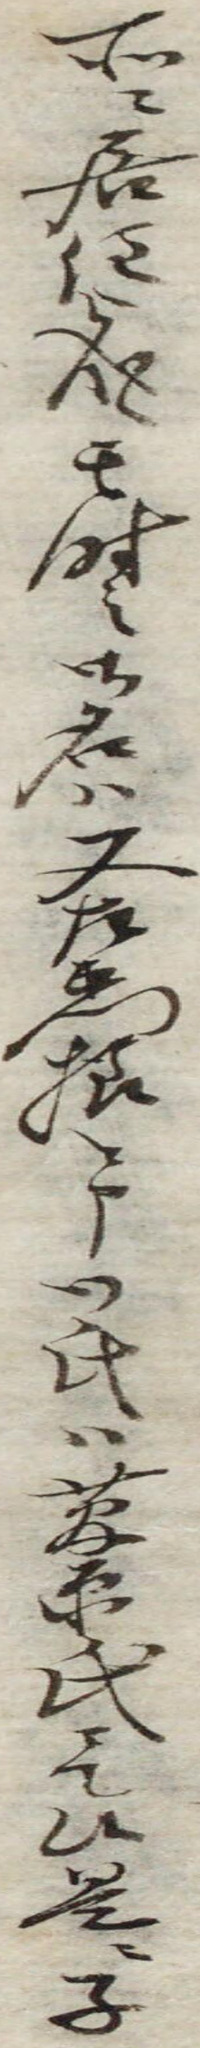所に居住被成候其時之御名は又左衛門様と申御氏は菅原氏にて候是に子
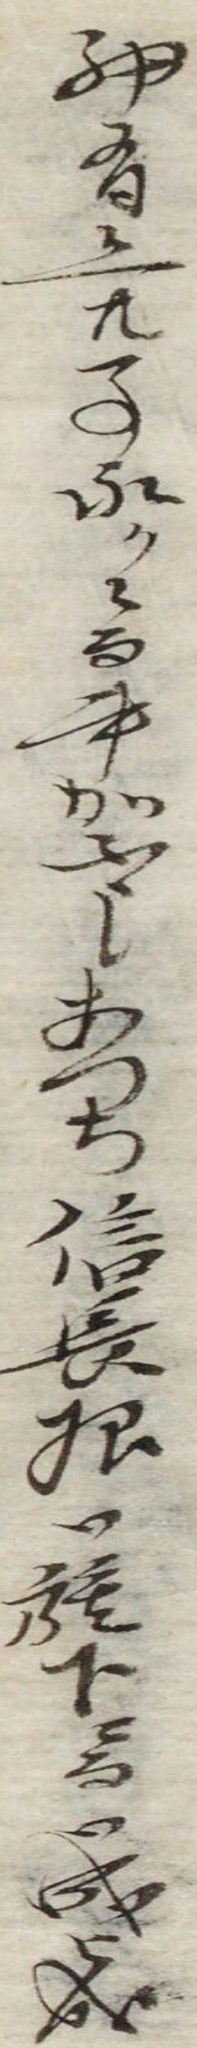細有候へ共事永くに而事加ふ申候あつち信長様旗下に而御成被成
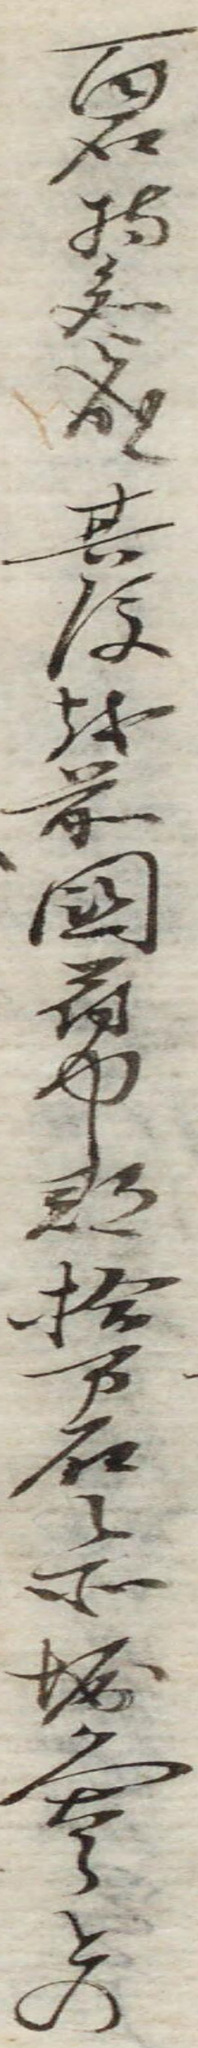百石持候処被成候其後越前国府中郡拾万石之所堀久太郎との
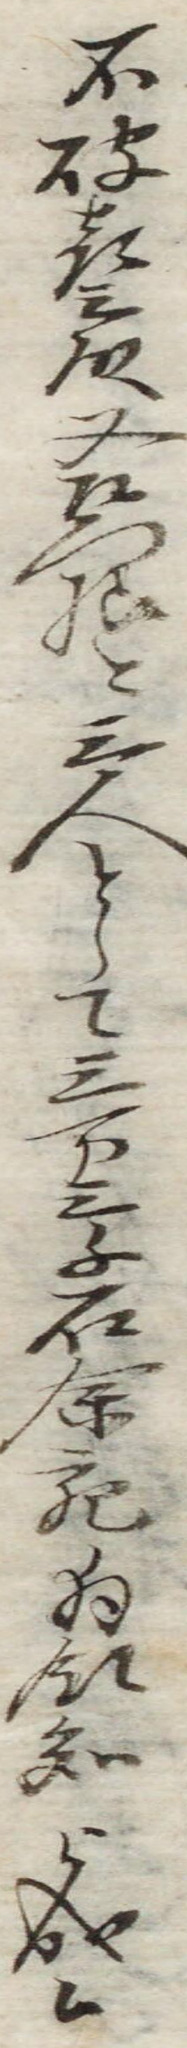不破喜三殿又左衛門様と三人として三万三千石余宛拝領候処被成候
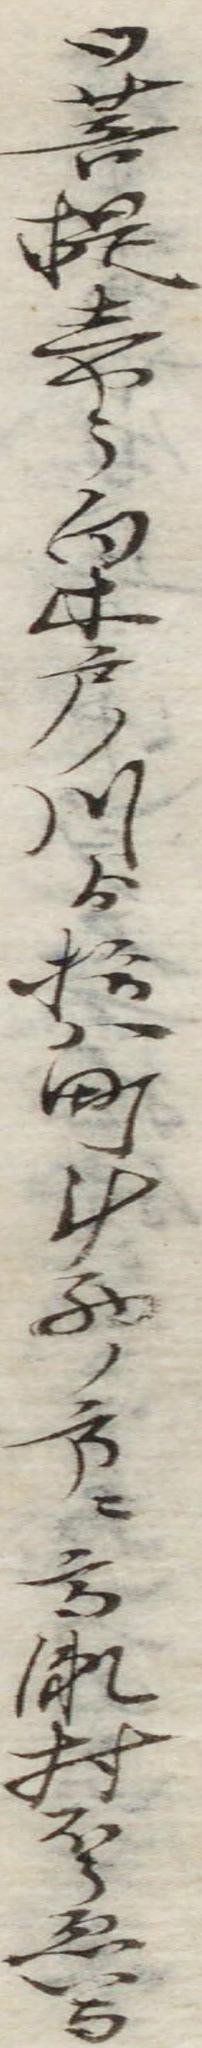御菩提しやう白木戸ノ川ゟ拾八町斗西ノ方に高瀬村ほうゑい寺
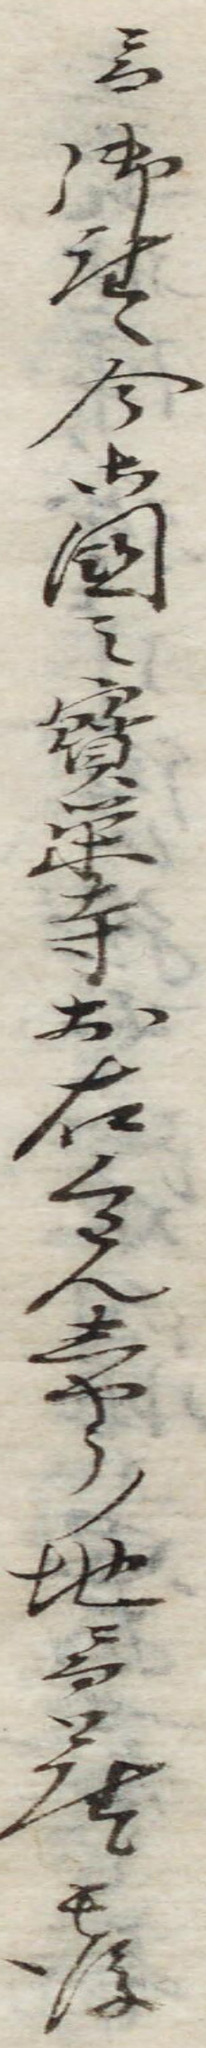に而御座候今御国之宝栄寺於右くわんしやうノ地に而御座候其後
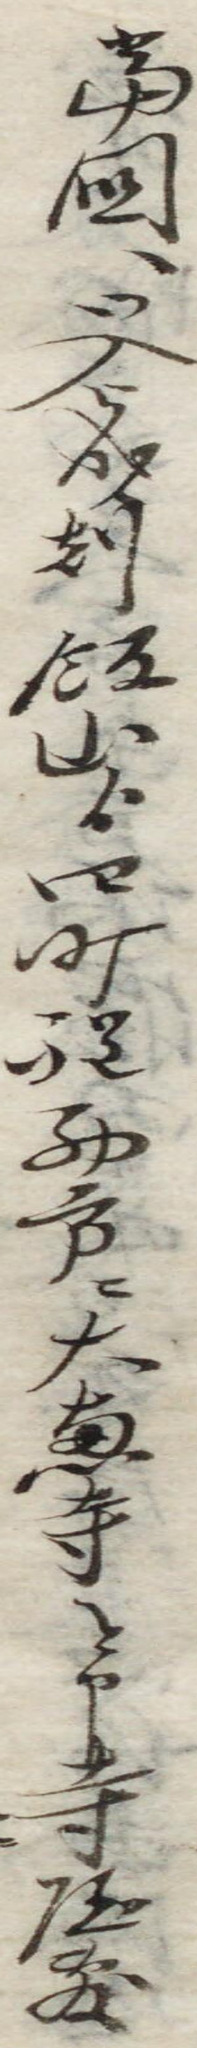当国へ御入被成候刻飯山ゟ四町程西方に大恵寺と申寺屋敷
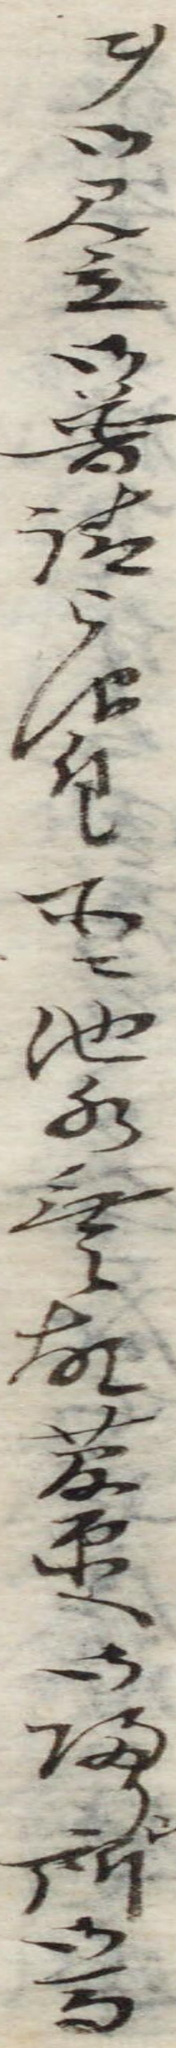を御見立御普請被仰付候所に池水無之故菅原へ御帰り所御馬
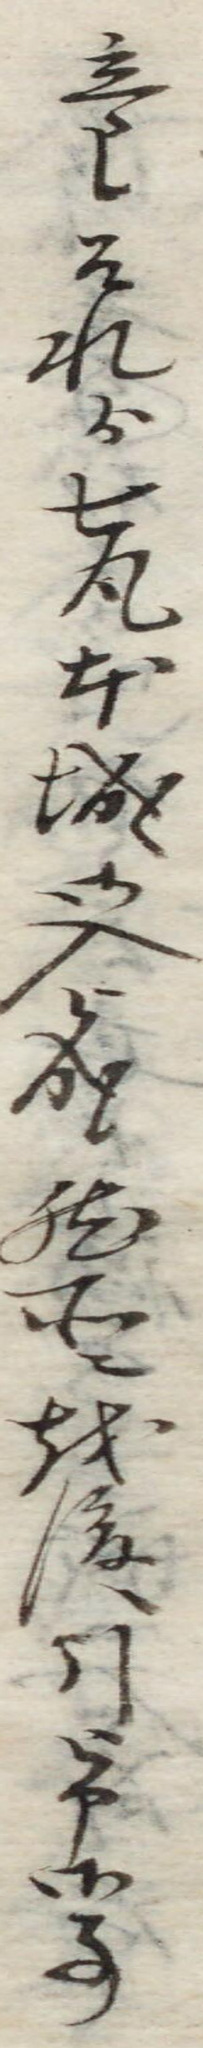立申候それゟ七尾本城へ御入被成候然所に越後へ引被申御事
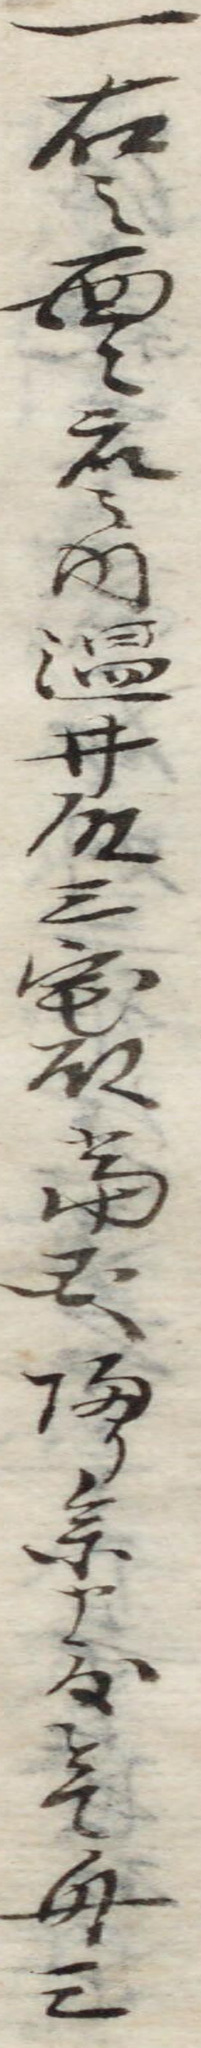一右之面々衆之内温井殿三宅殿当国へ帰り参申度とて舟三
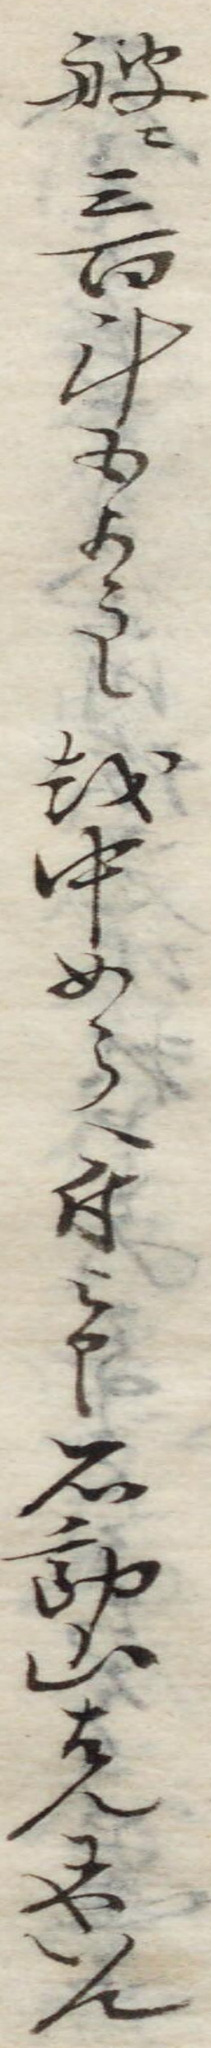艘に三百斗もようし越中めらへ付被申石動山はんにやいん
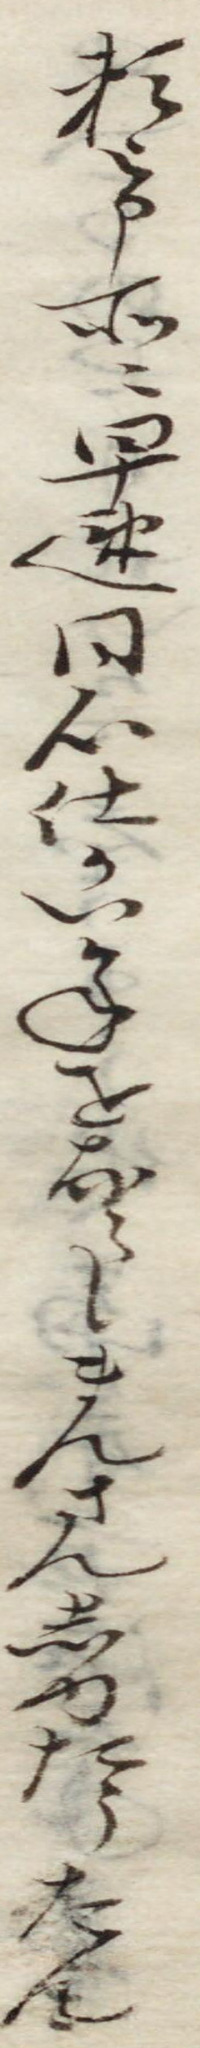頼被申所に早速同心仕かいかねをならしまんさんしゆたうたん
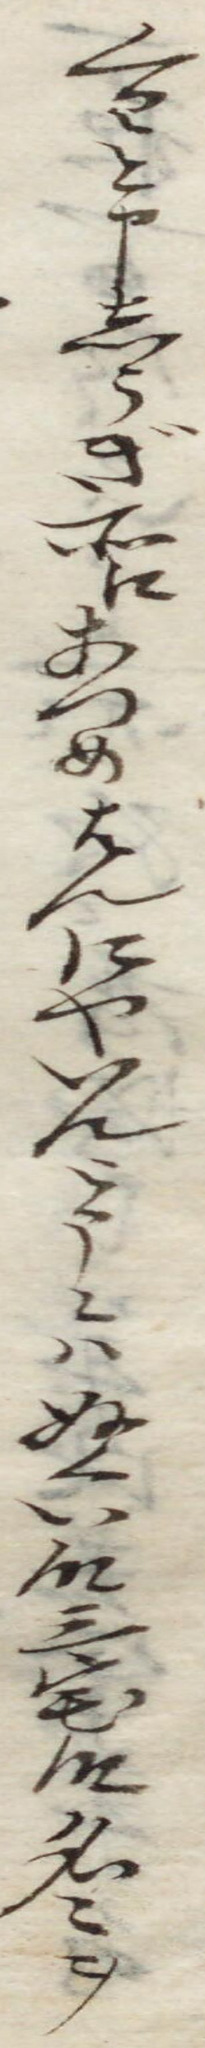くわと申しうぎ所えあつめはんにやいん被申にはぬくい殿三宅殿名々を
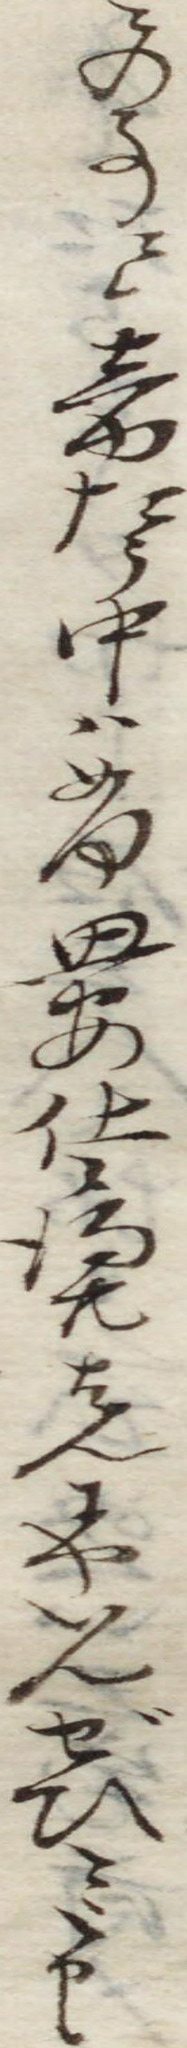との事に候しゆたう中は如何思安仕候得共はんにやいんぜひと被申候
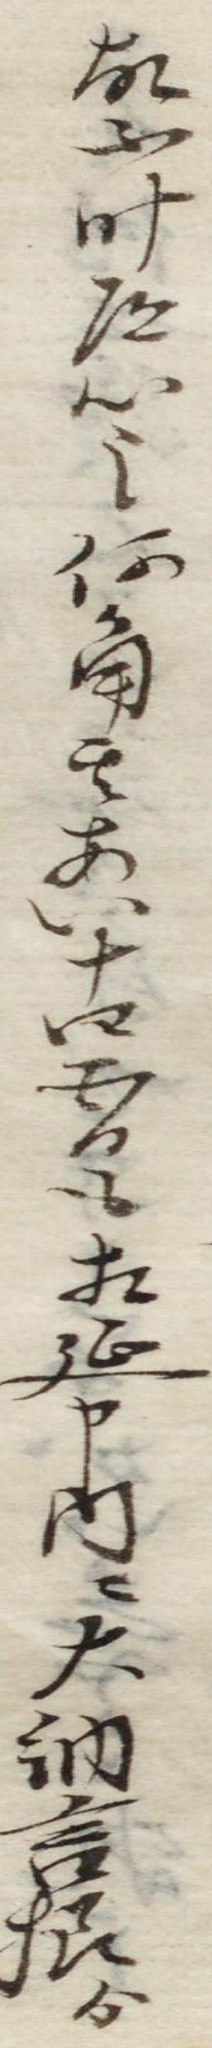故不叶道心申候何角其あい十四五日も相延申内に大納言様ゟ
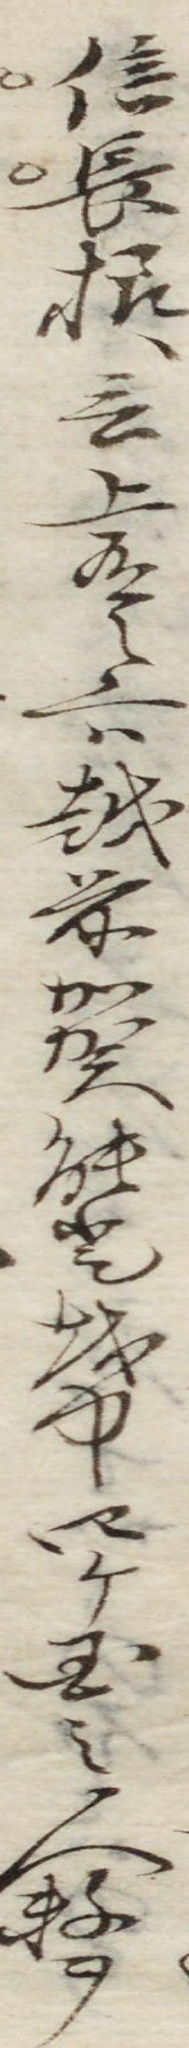信長様へ言上有之候へは越前加賀能登越中四ヶ国之人数を
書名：古老紀談等
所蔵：Ishikawa Prefectural Library
